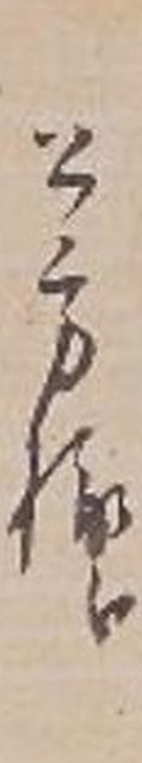公方様え
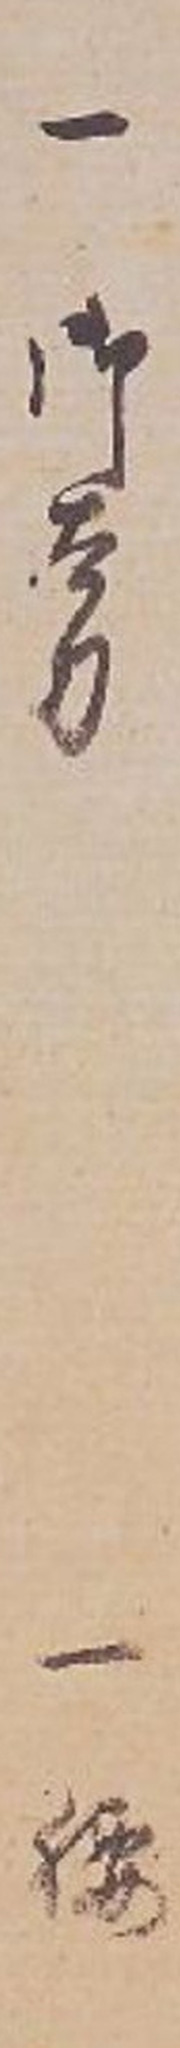一御太刀一腰
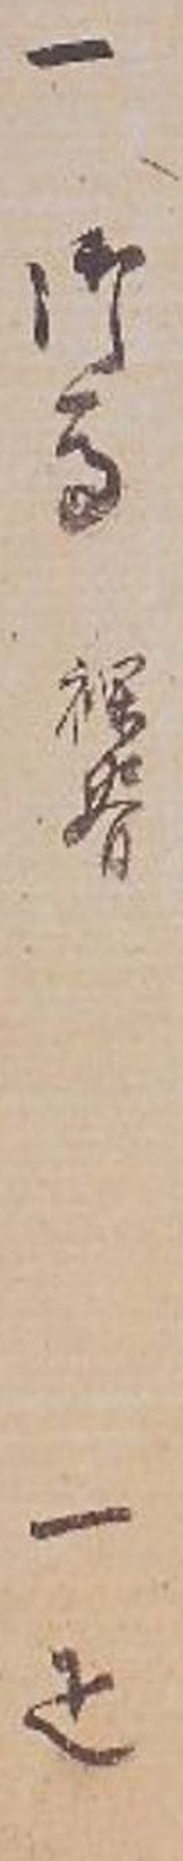一御馬裸背一疋
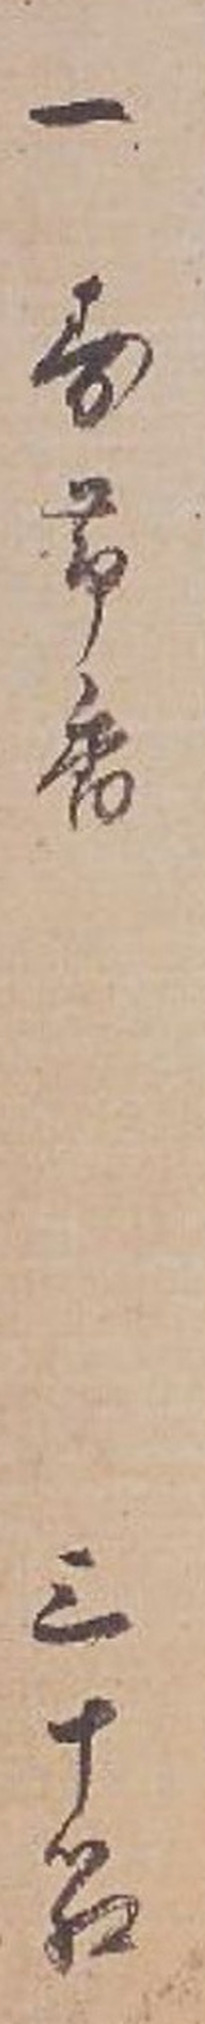一寿帯香三十箱

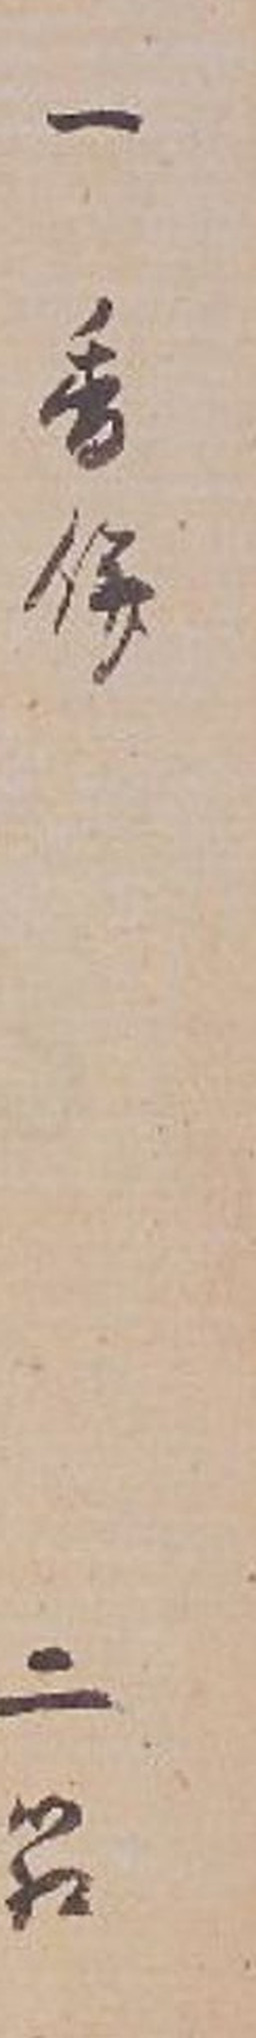一香餅二箱
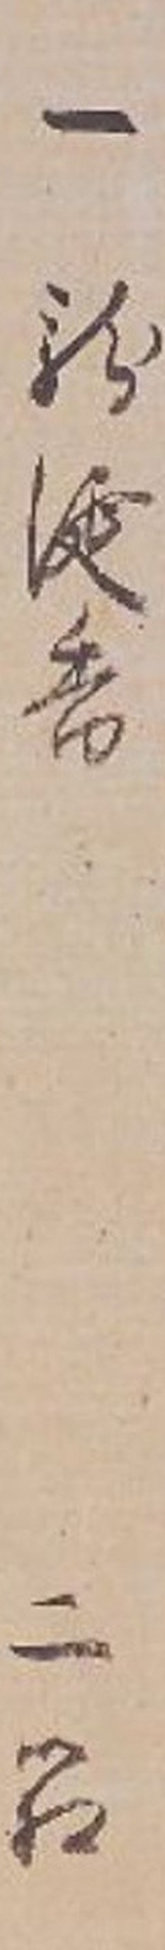一龍涎香二箱
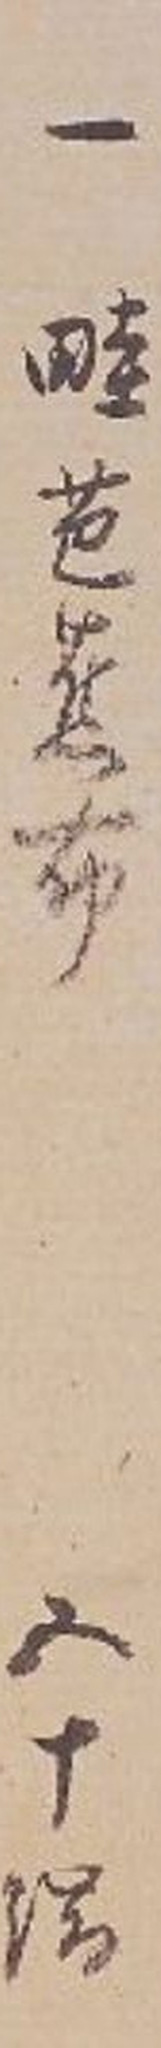一畦芭蕉布五十端
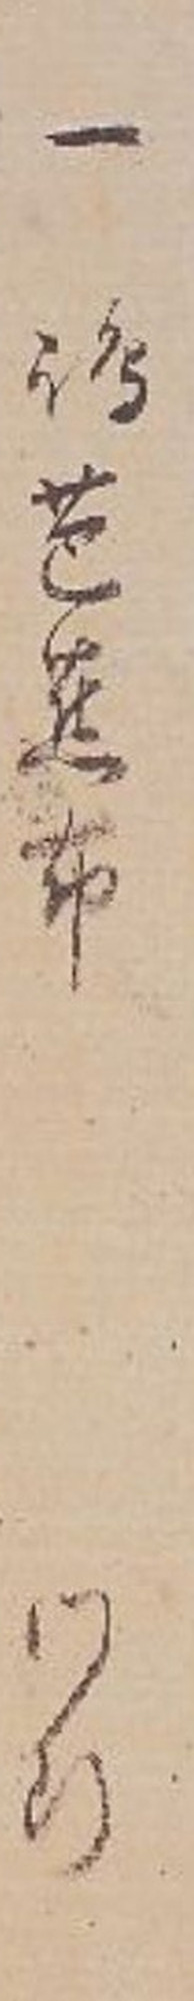一島芭蕉布同断
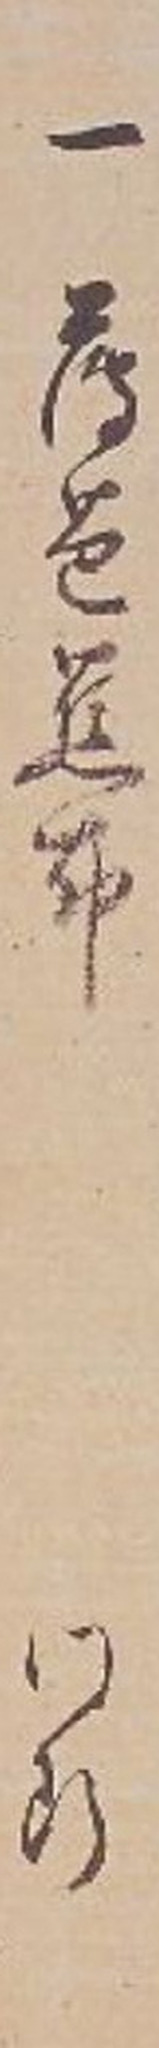一薄芭蕉布同断
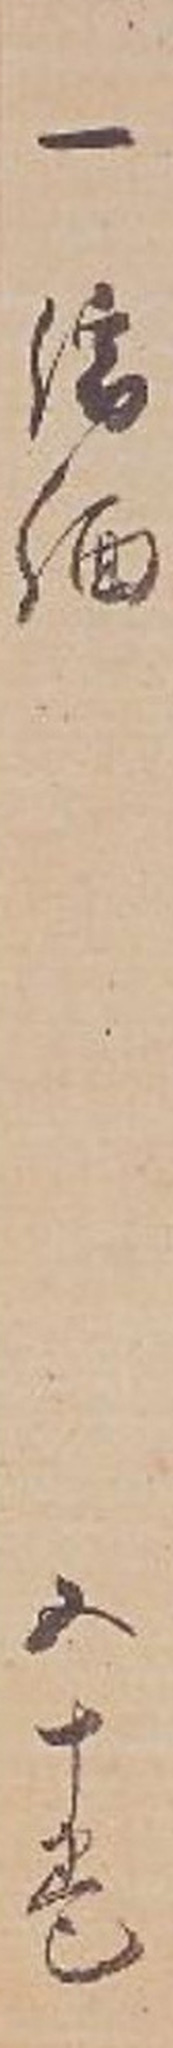一縮緬五十巻
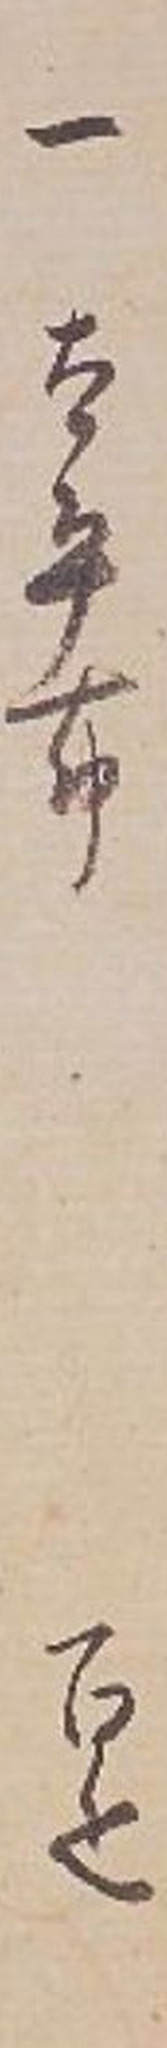一太平布百疋
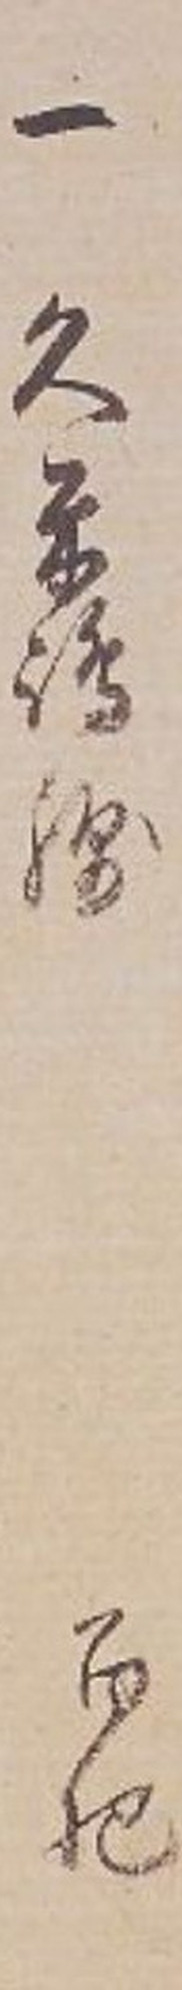一久米島綿百把
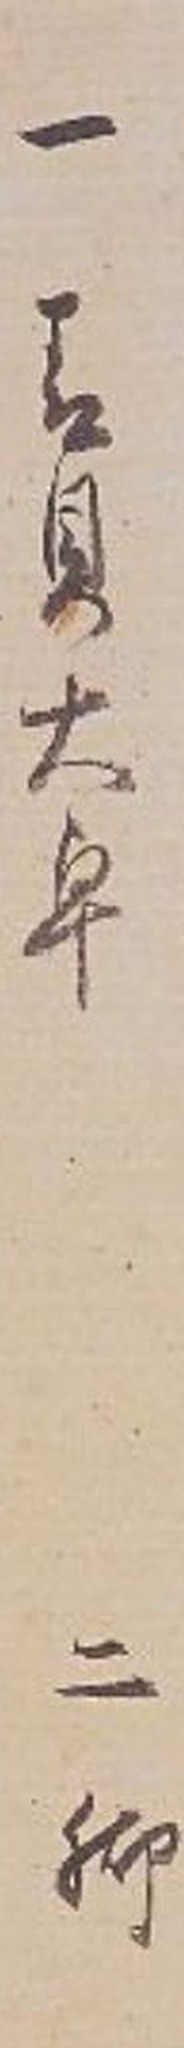一青貝大卓二脚
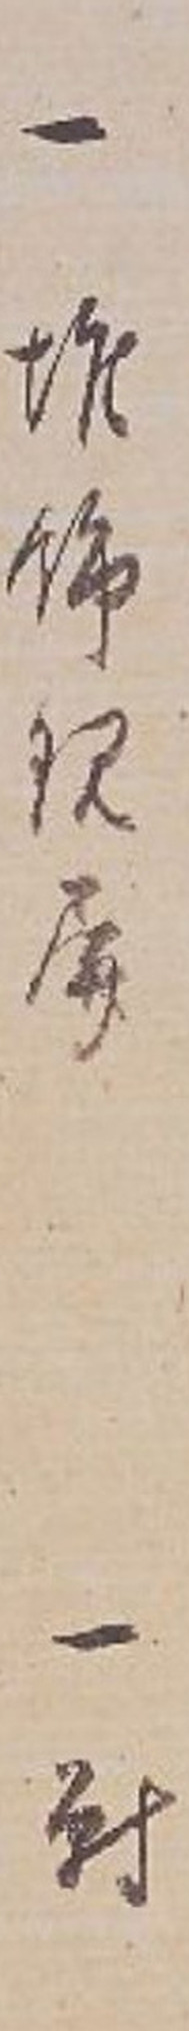一堆綿硯屏一対
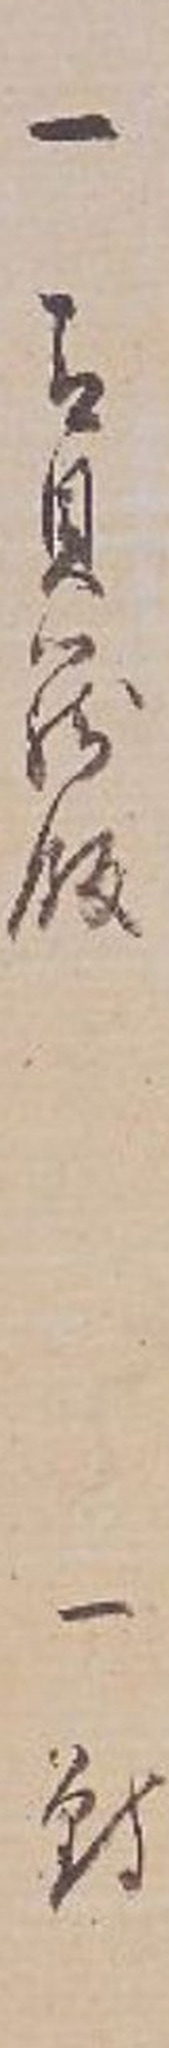一青貝籠版一対
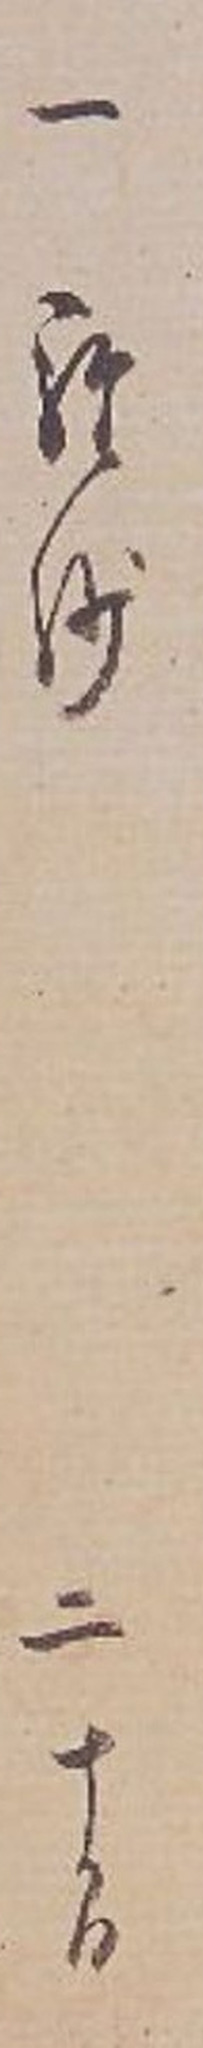一羅沙二十間
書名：琉球人来朝記 五、六、七
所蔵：University of the Ryukyus Library
